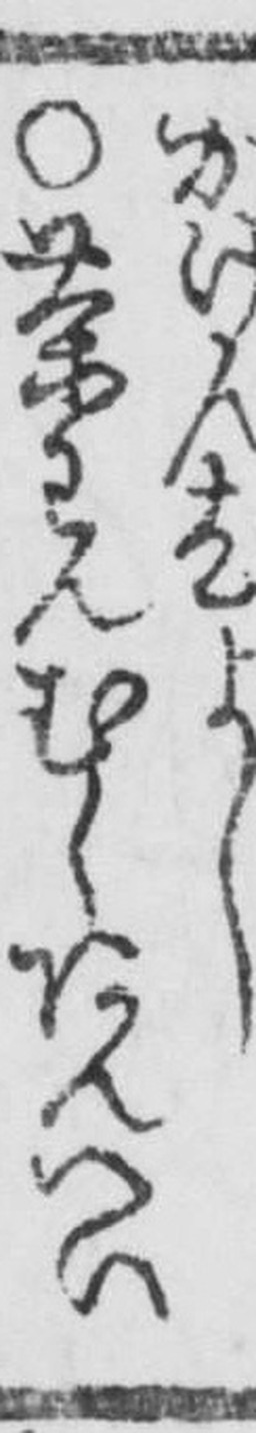○茶わんむしあんへい
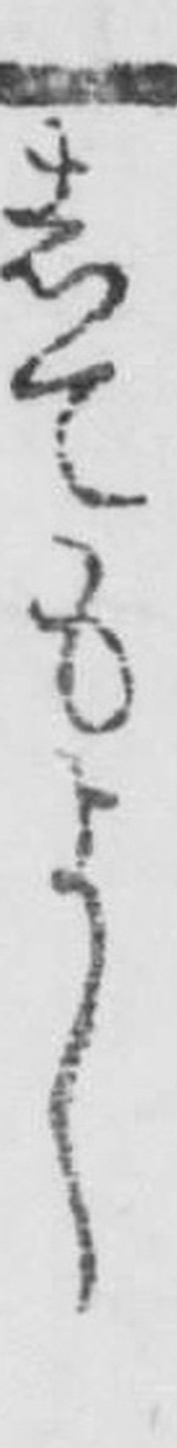してもよし
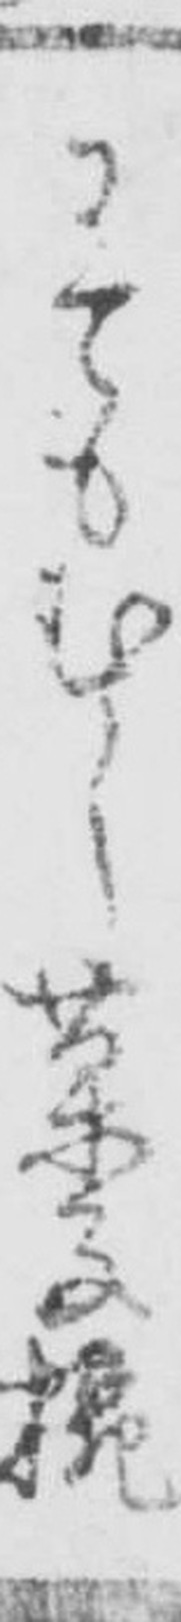にてもむし菓子椀
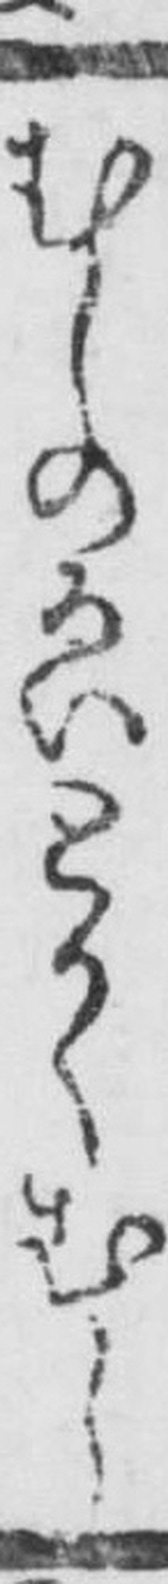むしのるいとかくむし
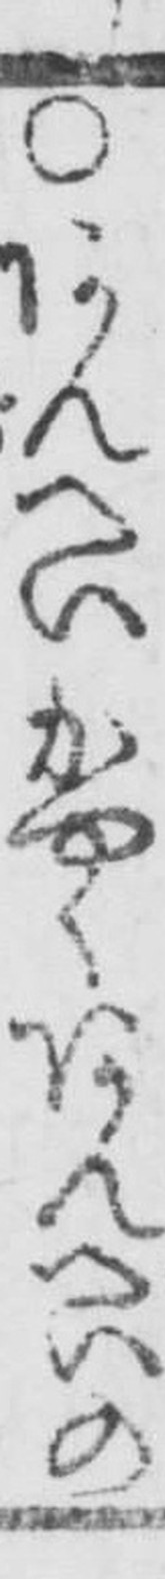○あんへいかやくあんべいの
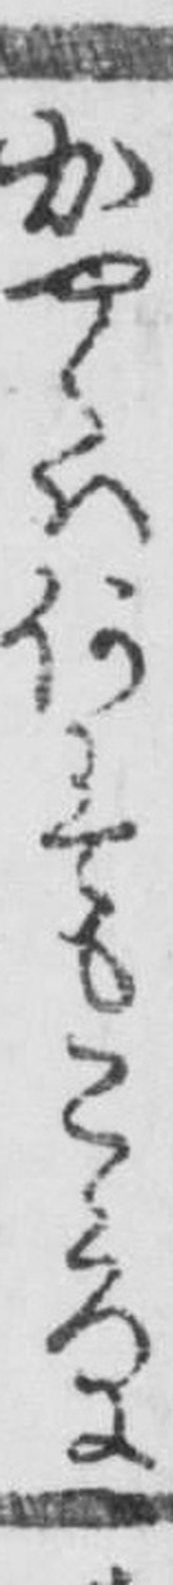かやくは何にてもこゝろに
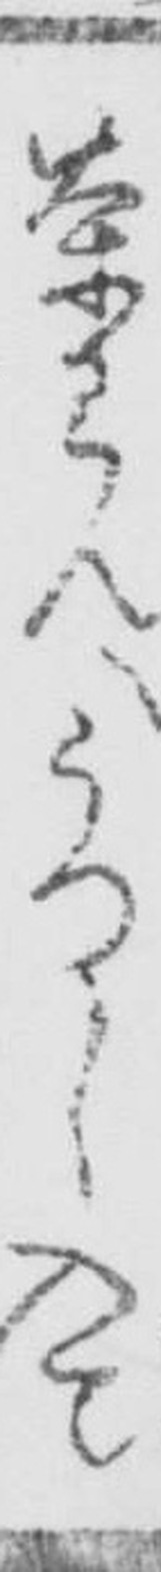茶わんへうつし入て
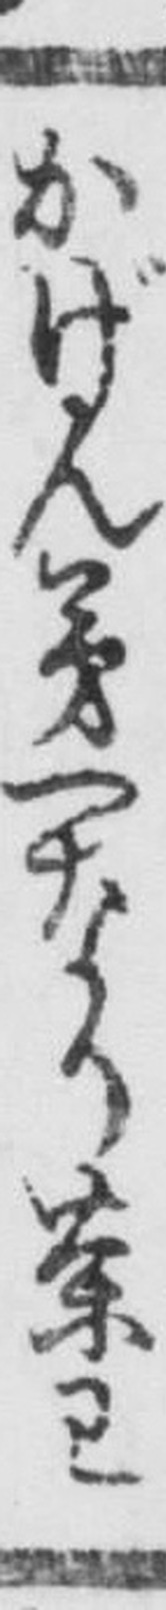かげん第一なり茶わ
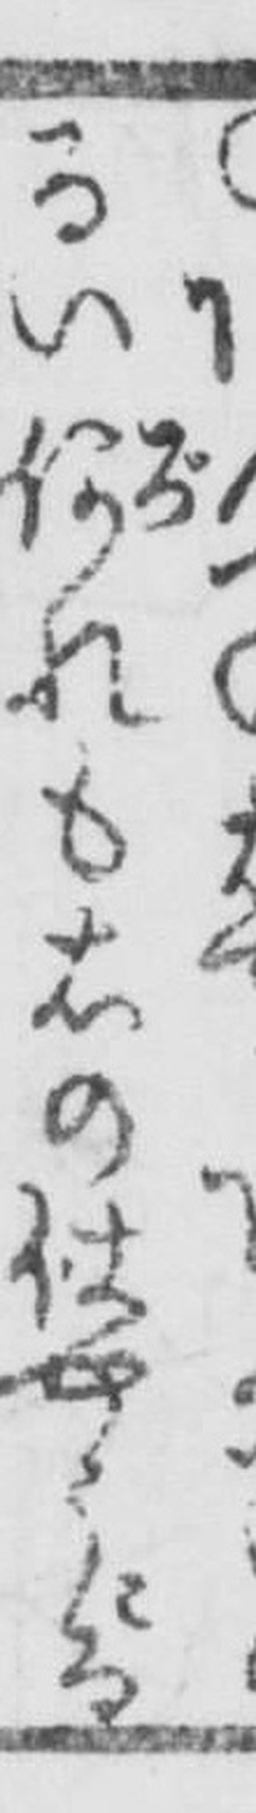るい何れも右のしやうにて
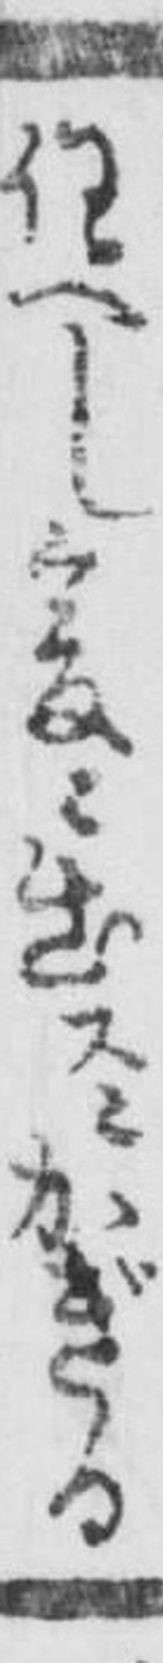任へし爰に出すにかぎる
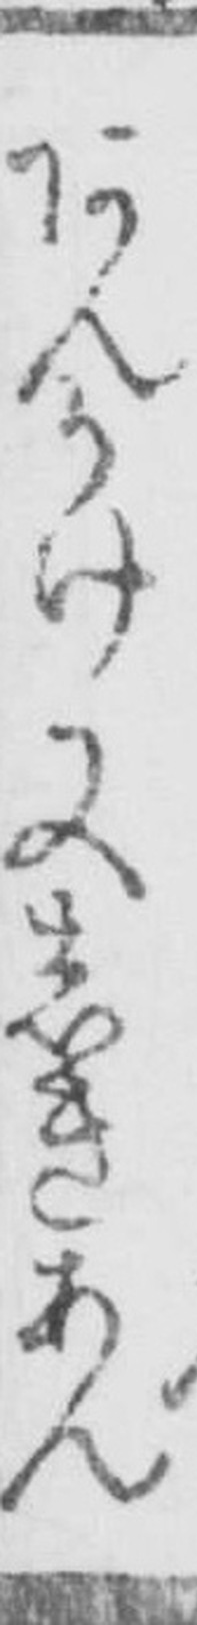あんかけ又しきあん
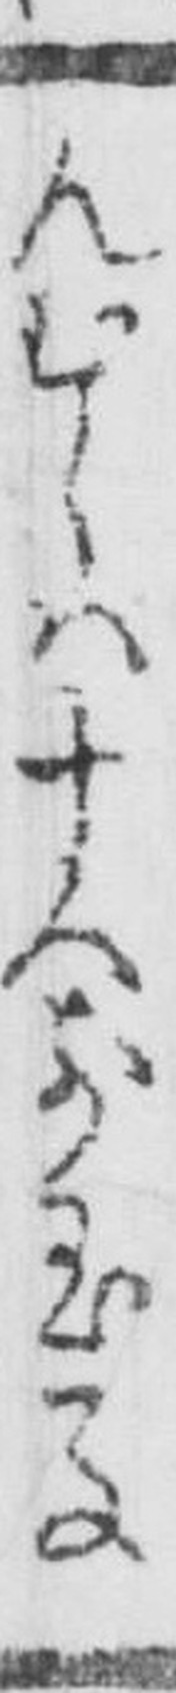んむしは十人前玉子
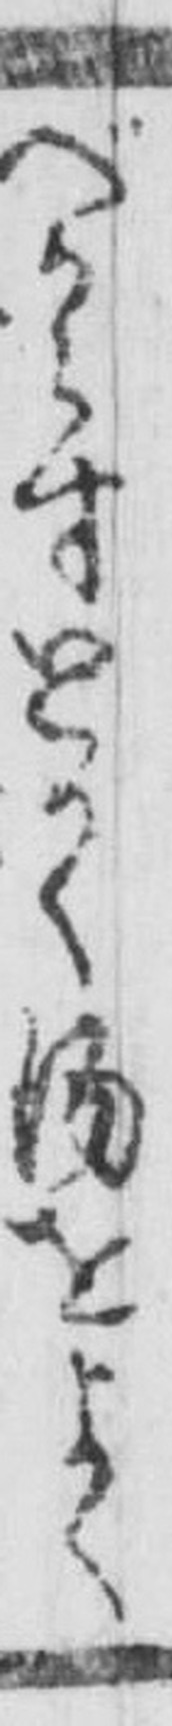べからすとかく湯をよく
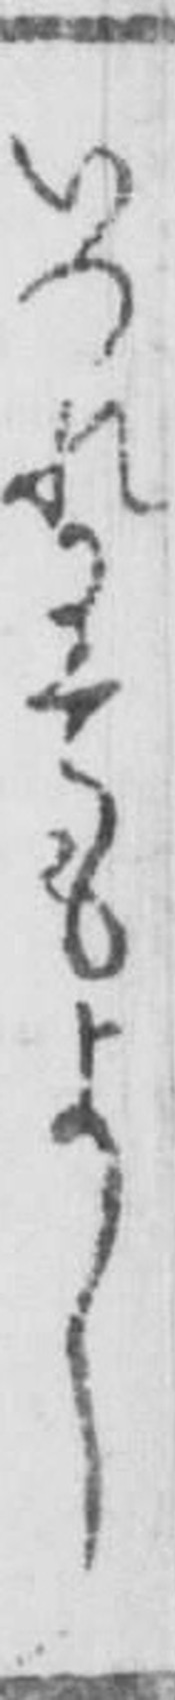いつれにてもよし
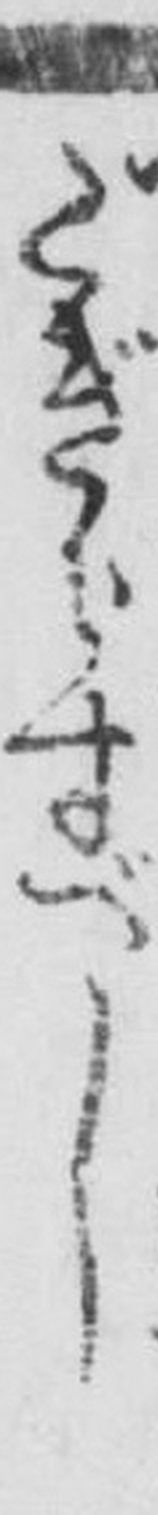たぎらすべし
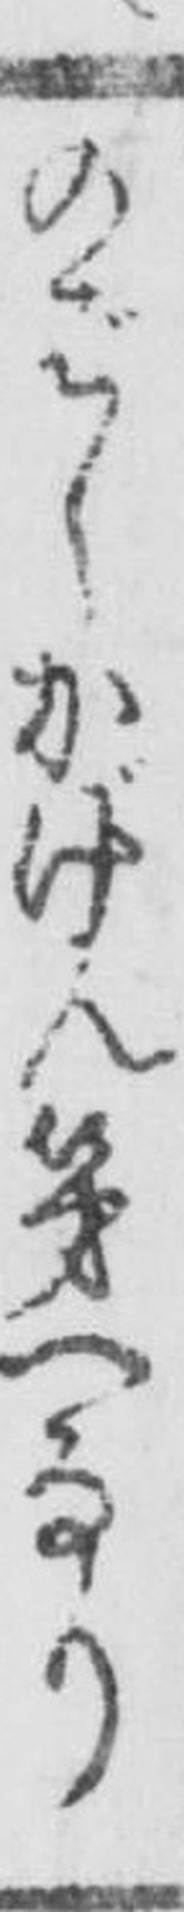のばしかげん第一なり
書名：諸家通用/即席料理
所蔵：大阪府立大学学術情報センター 国文学研究資料館
